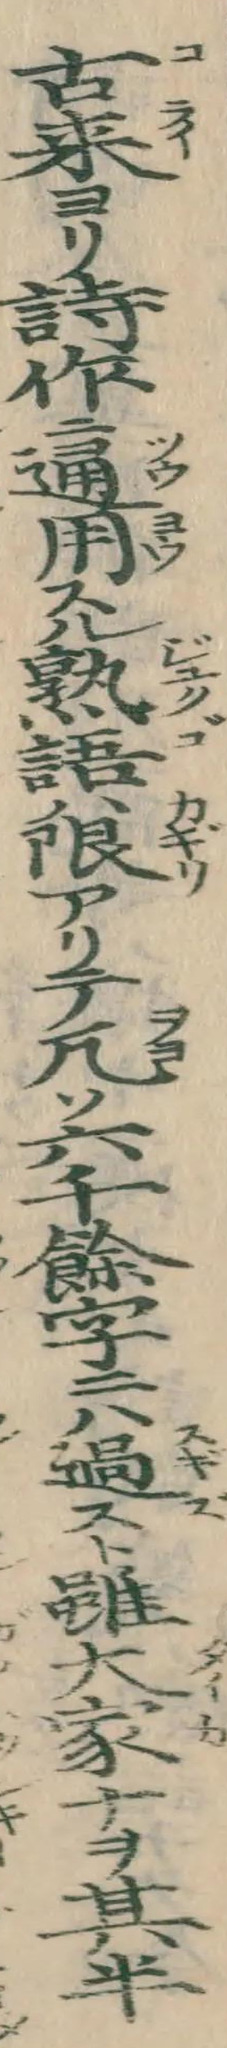古来ヨリ詩作ニ通用スル熟語ハ限アリテ凡ソ六千余字ニハ過スト雖大家ナヲ其半
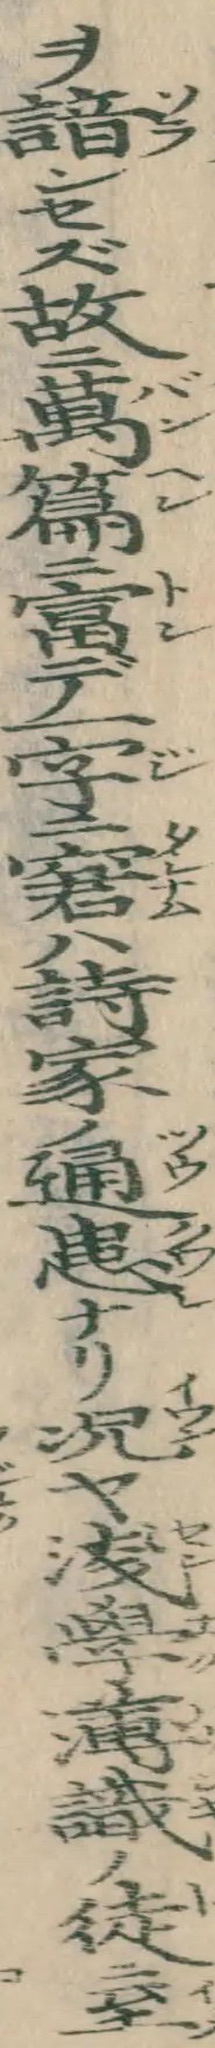ヲ諳ンセズ故ニ万篇ニ富デ一字ニ窘ハ詩家ノ通患ナリ況ヤ浅学薄識ノ徒ニ至
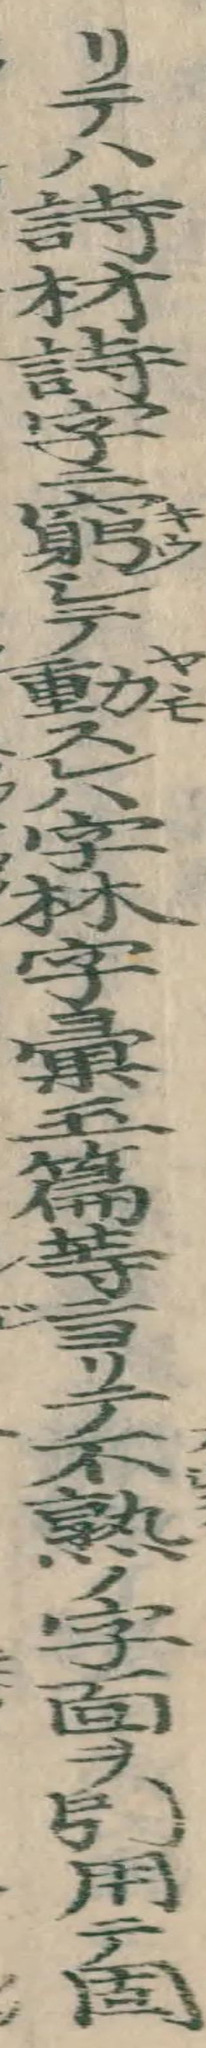リテハ詩材詩字ニ窮シテ動スレハ字林字彙玉篇等ニヨリテ不熟ノ字面ヲ引用テ固
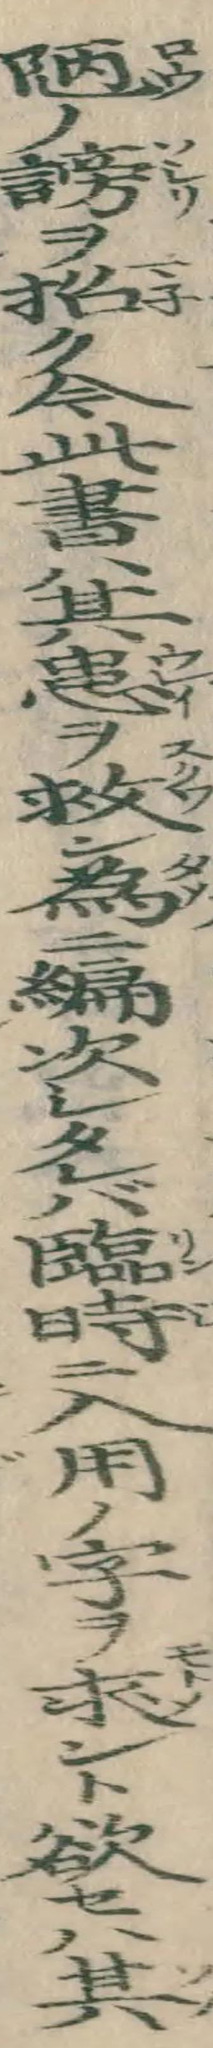陋ノ謗ヲ招ク今此書ハ其患ヲ救ン為ニ編次シタレバ臨時ニ入用ノ字ヲ求ント欲セハ其
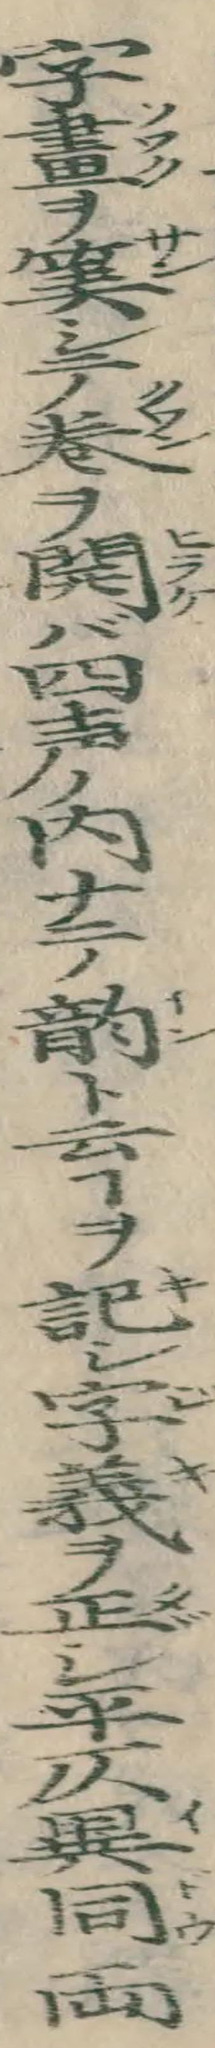字画ヲ算シテ巻ヲ開バ四声ノ内ナニノ韵ト云コトヲ記シ字義ヲ正シ平仄異同両
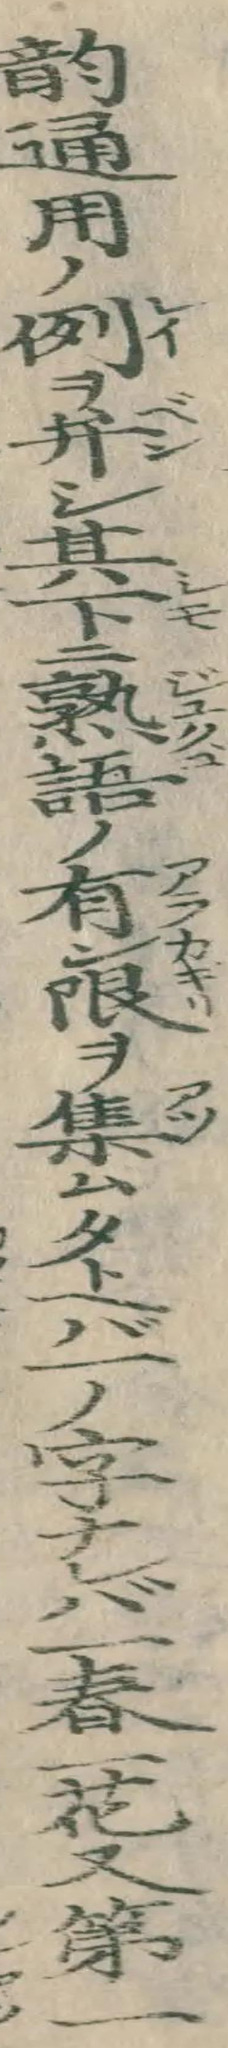韵通用ノ例ヲ弁シ其下ニ熟語ノ有ン限ヲ集ムタトヘバ一ノ字ナレバ一春一花又第一
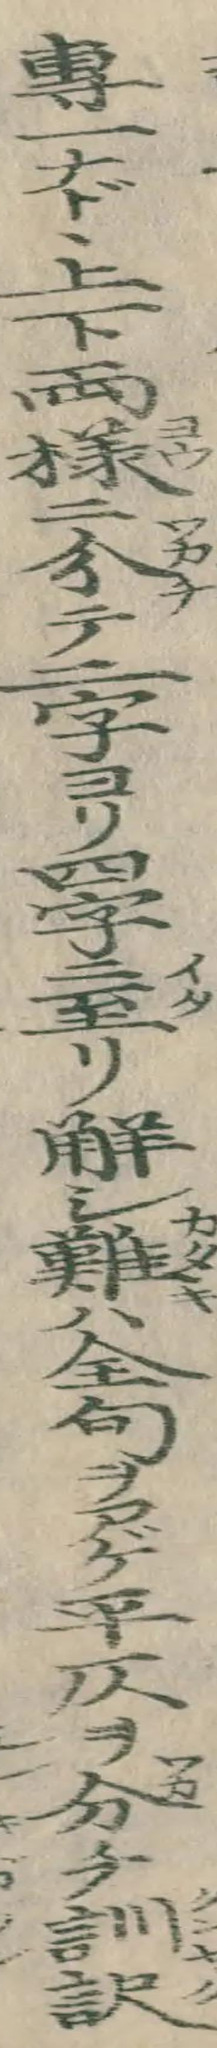専一ナドヽ上下両様に分テ二字ヨリ四字ニ至リ解シ難ハ全句ヲアゲ平仄ヲ分チ訓訳
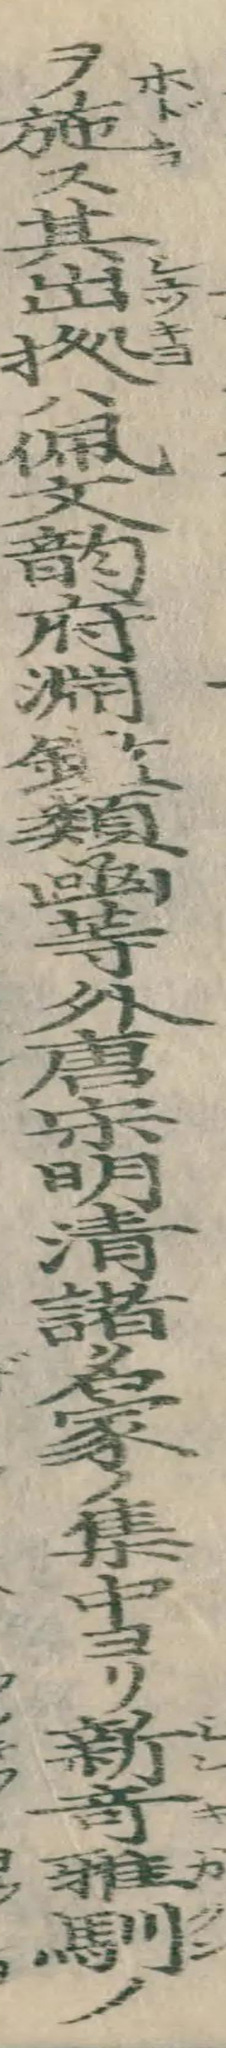ヲ施ス其出拠ハ佩文韵府淵鑑類函等外唐宋明清諸名家ノ集中ヨリ新奇雅馴ノ
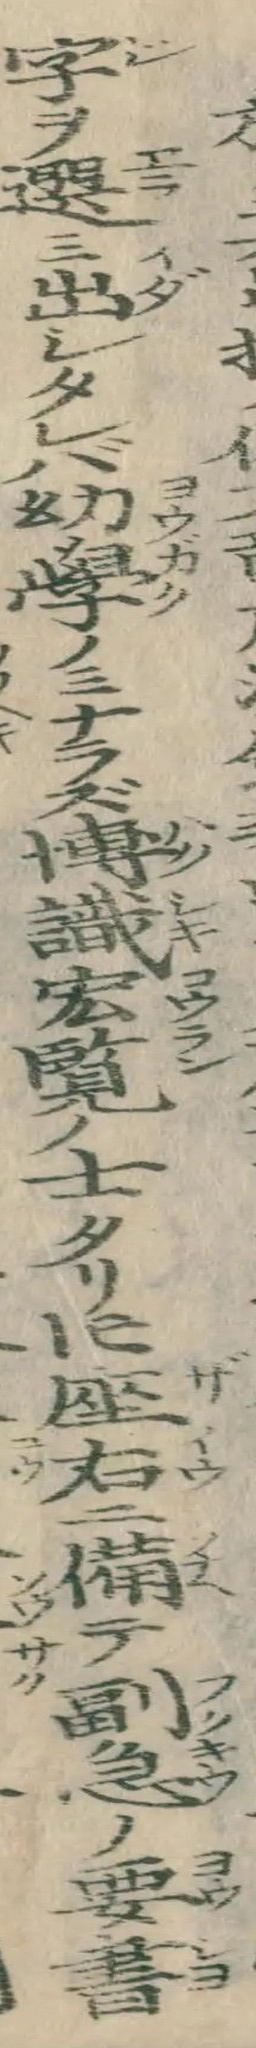字ヲ選ミ出シタレバ幼学ノミナラズ博識宏覧ノ士タリトモ座右ニ備テ副急ノ要書
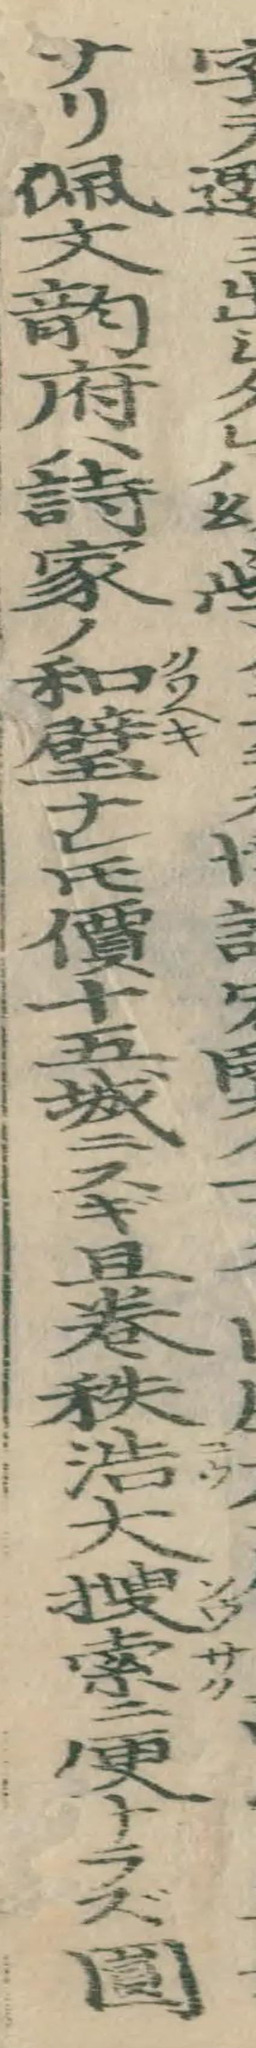ナリ佩文韵府ハ詩家ノ和璧ナレトモ価十五城ニスギ且巻秩浩大捜索ニ便ナラズ円

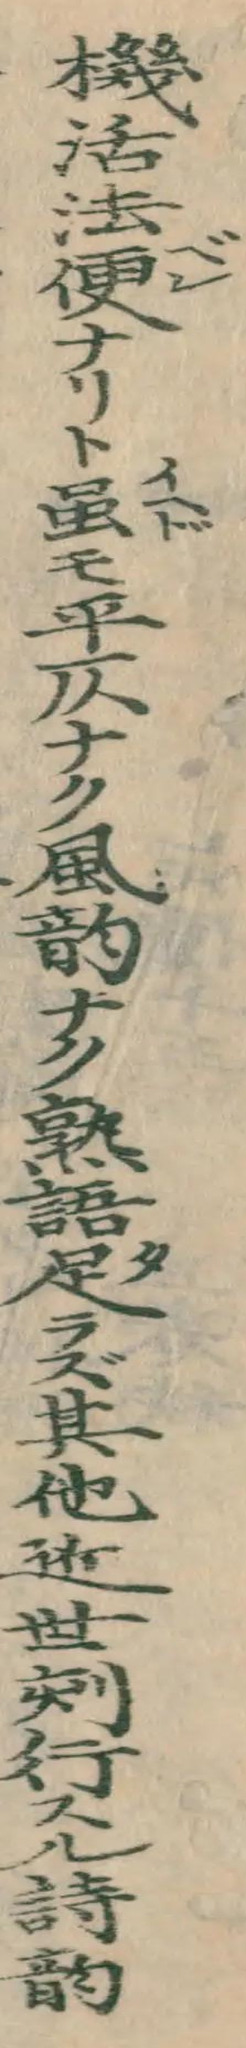機活法便ナリト雖モ平仄ナク風韵ナク熟語足ラズ其他近世刻行スル詩韵
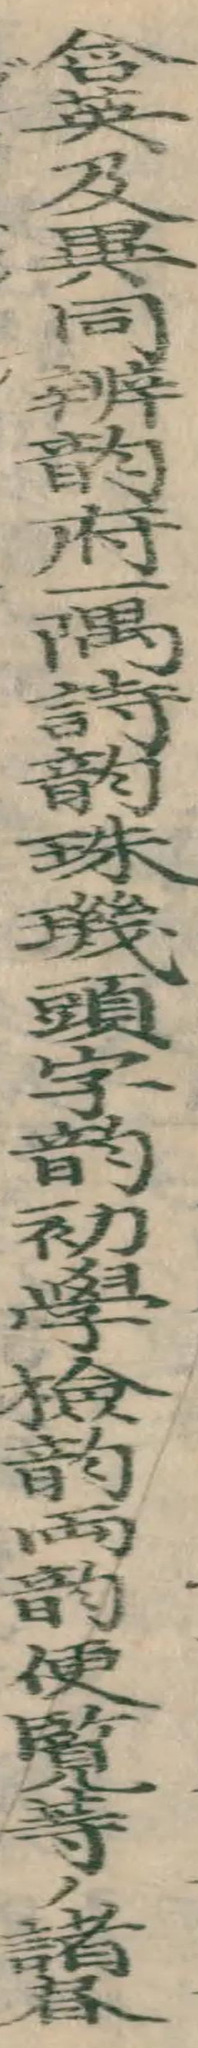含英及異同弁韵府一隅詩韵珠璣頭字韵初学検韵両韵便覧等ノ諸書
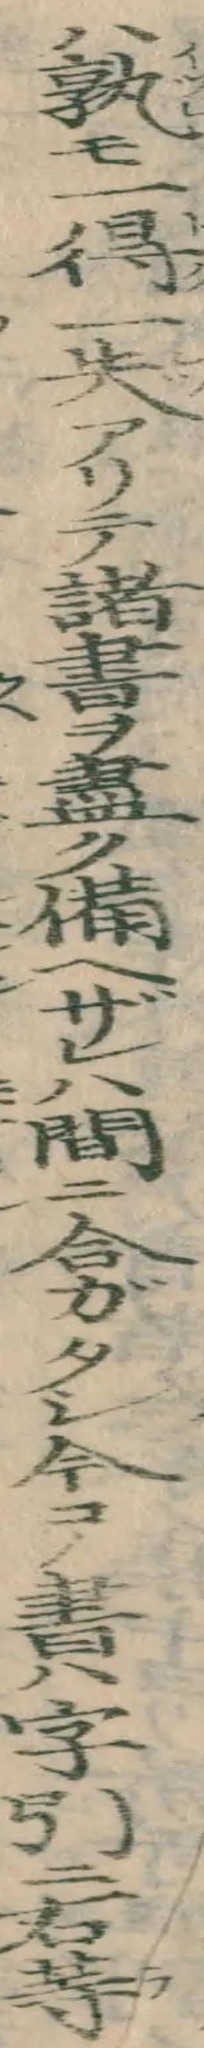ハ孰モ一得一失アリテ諸書ヲ尽ク備ヘザレハ間ニ合ガタシ今コノ書ハ字引ニ右等
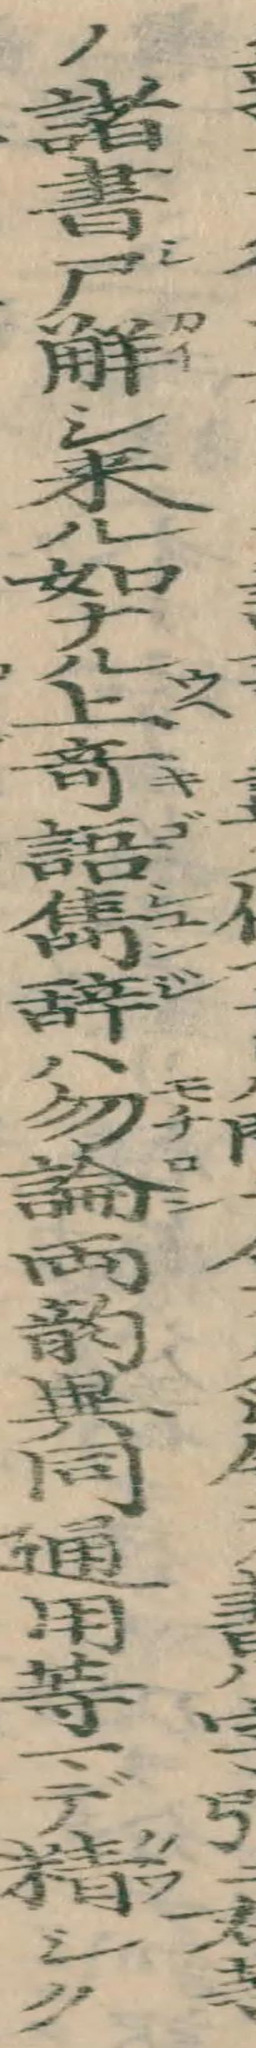ノ諸書尸解シ来ル如ナル上奇語雋辞ハ勿論両韵異同通用等マデ精シク
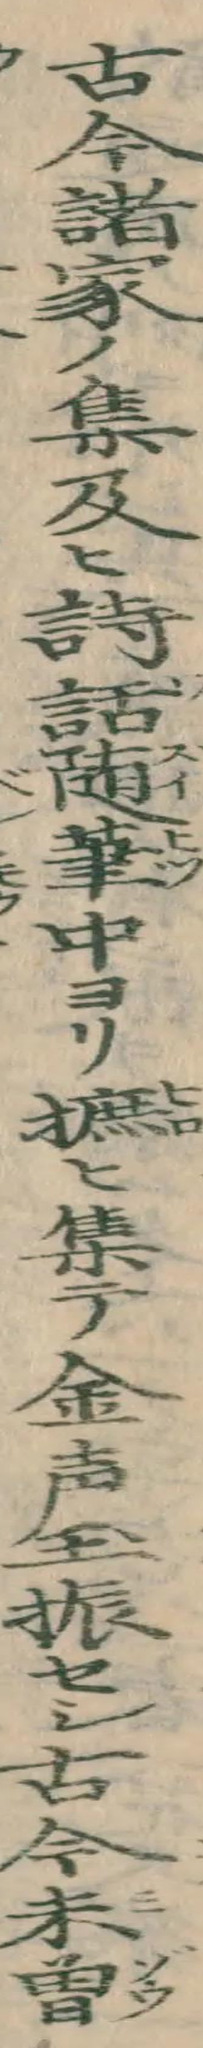古今諸家ノ集及ヒ詩話随筆中ヨリ摭ヒ集テ金声玉振セシ古今未曽
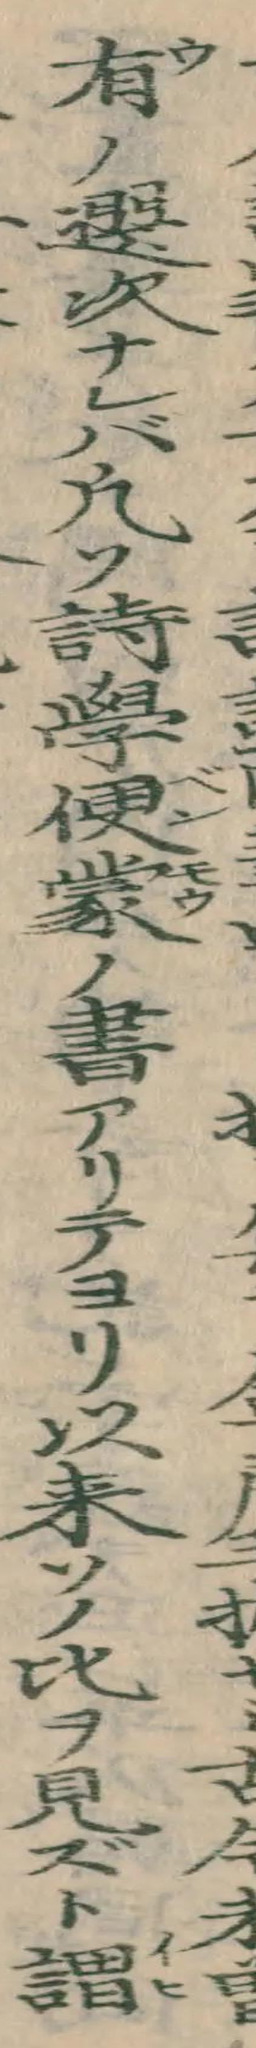有ノ選次ナレバ凡ソ詩学便蒙ノ書アリテヨリ以来ソノ比ヲ見ズト謂
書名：これこれ草 2巻. [2]
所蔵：国立国会図書館 National Diet Library, JAPAN
